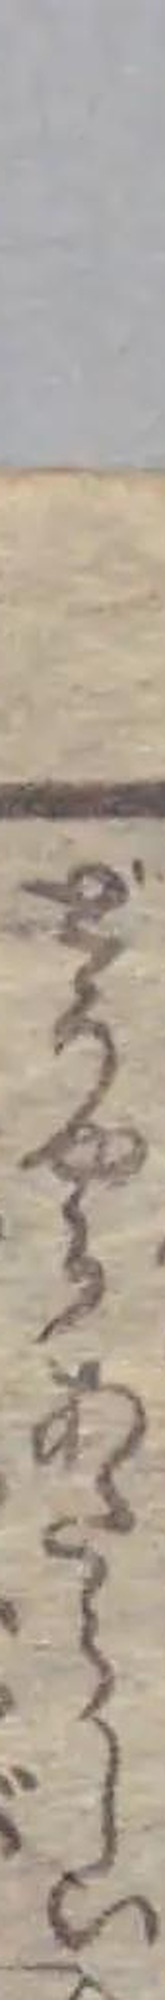どうやらあたらしい
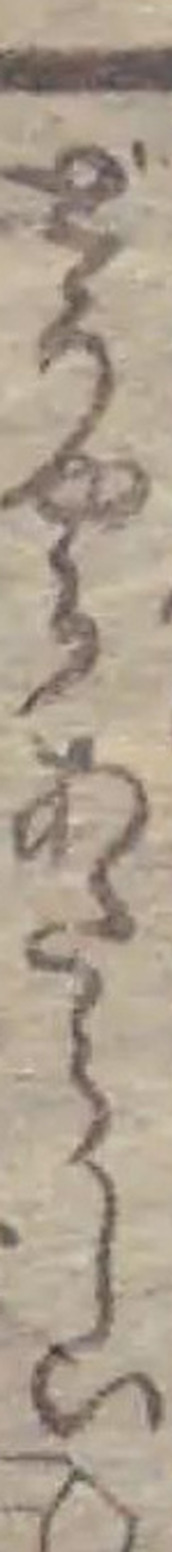どうやらあたらしい
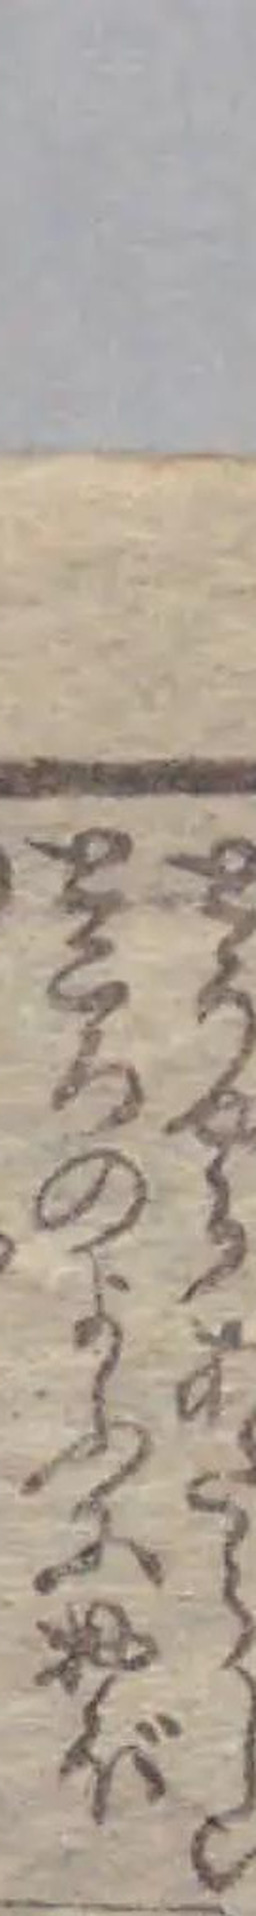ところのよふにおぼ
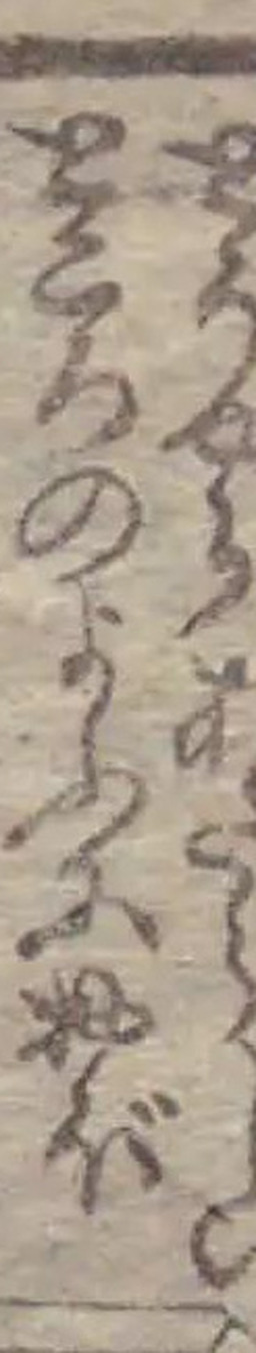ところのよふにおぼ
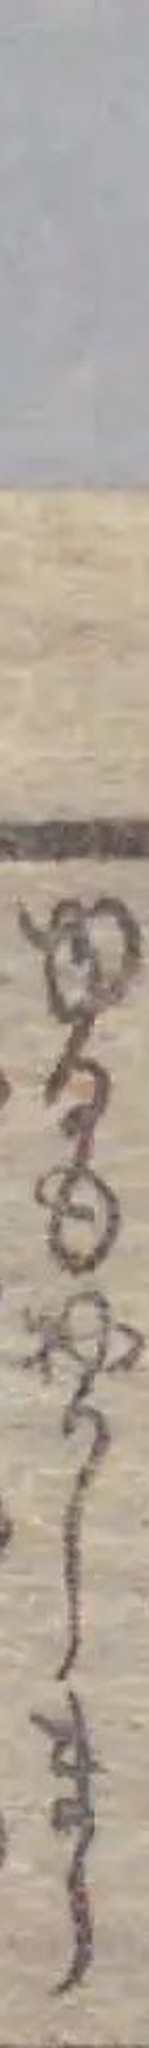ゆるもおかしまし
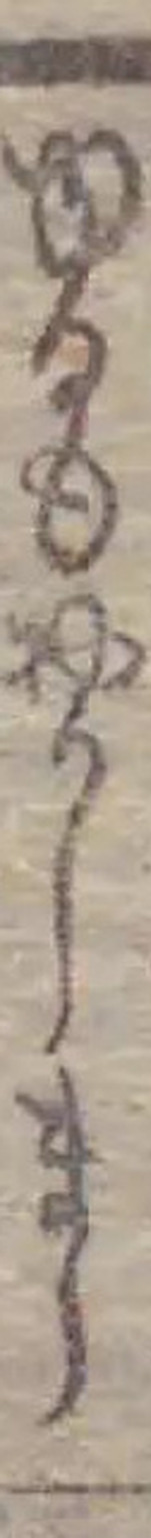ゆるもおかしまし
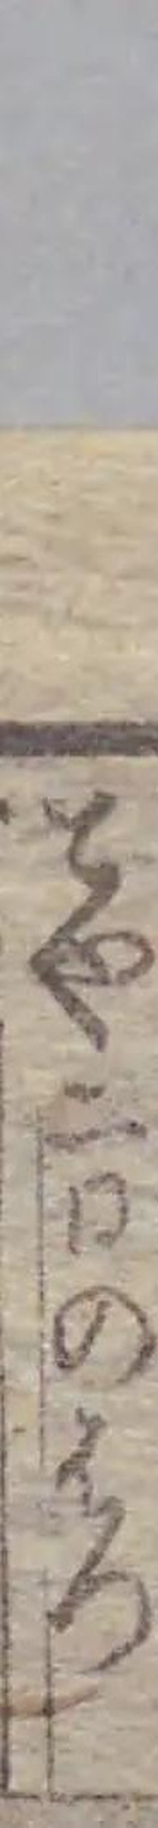てや二日のはつ
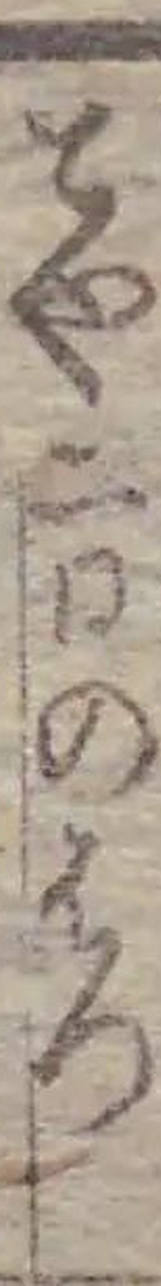てや二日のはつ
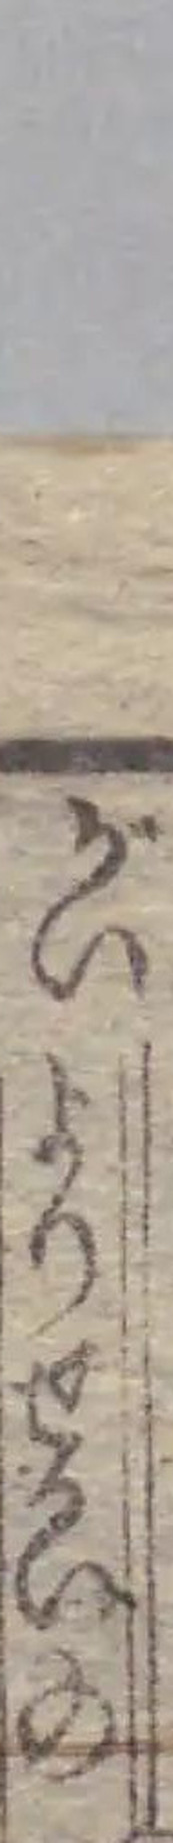がいよりせかいの
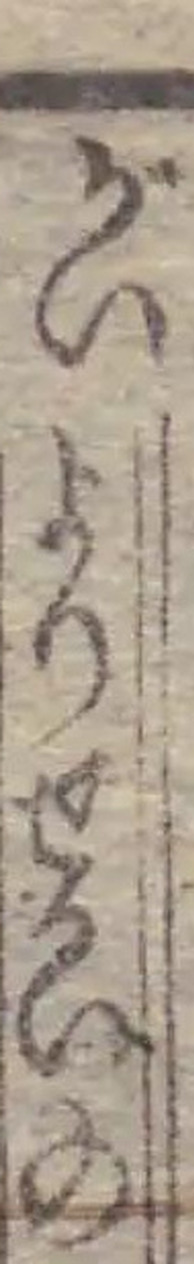がいよりせかいの
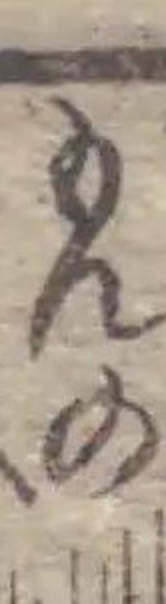もんの
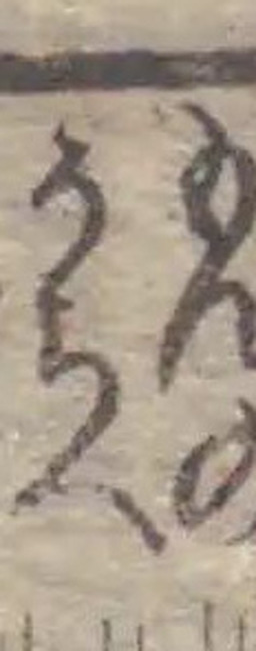うちへ
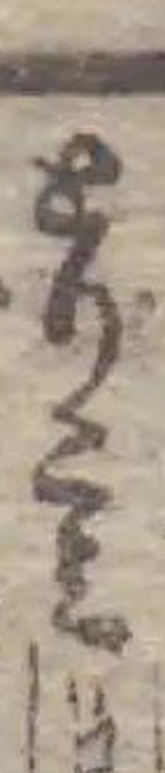とりこみ
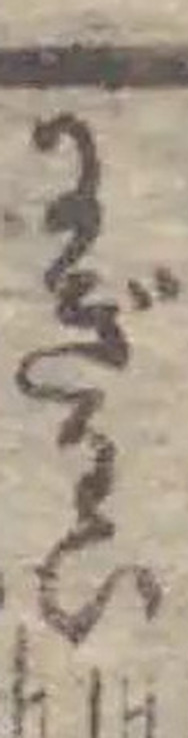にぎわい
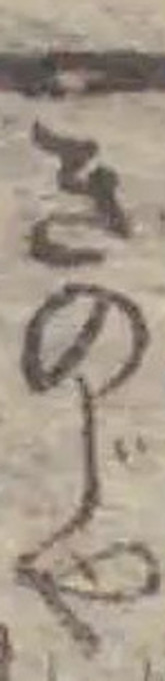きのじや
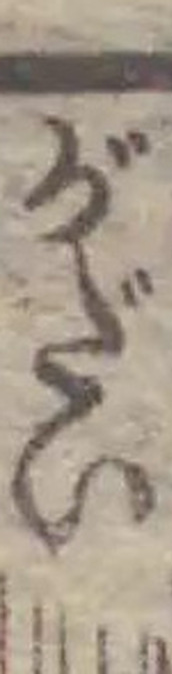がだい
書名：かんなんの夢枕 2巻
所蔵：国立国会図書館 National Diet Library, JAPAN
